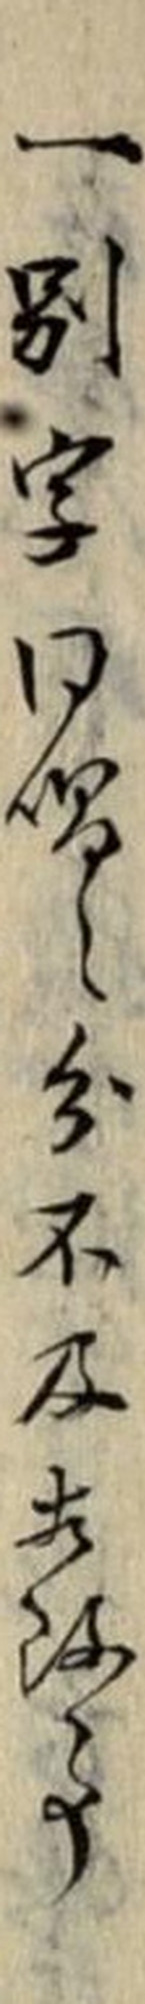一別字同唱之分不及相改事
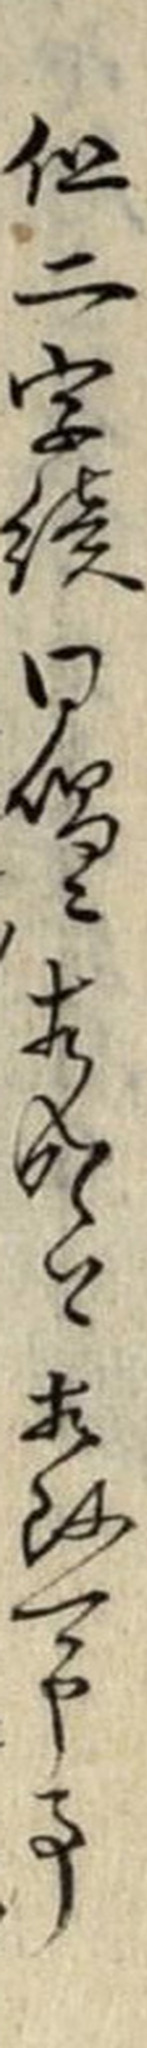但二字続同唱に相成候はゝ相改可申事
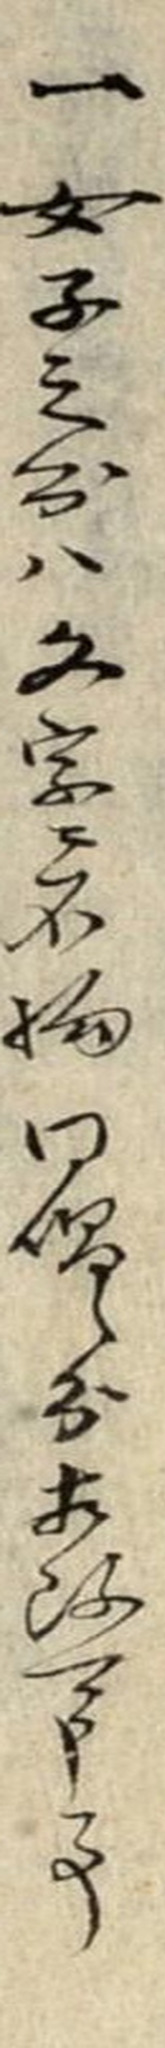一女子之分は文字に不拘同唱之分相改可申事
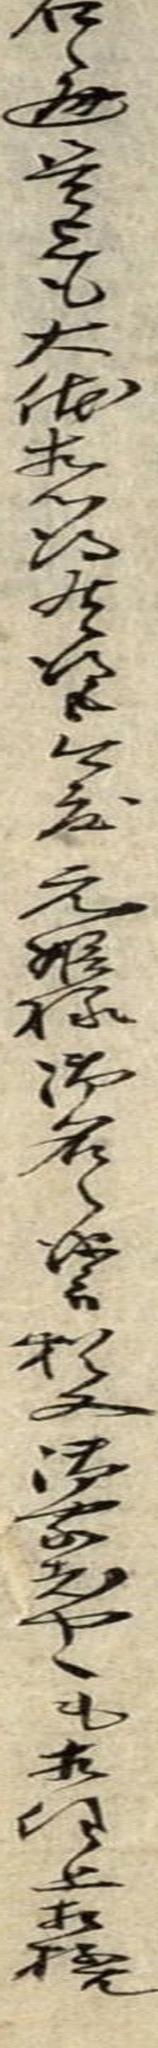右之通是迄も大体相心得居候得共今度元姫様御名之儀に付猶又御家老中へも相伺候上相極ル
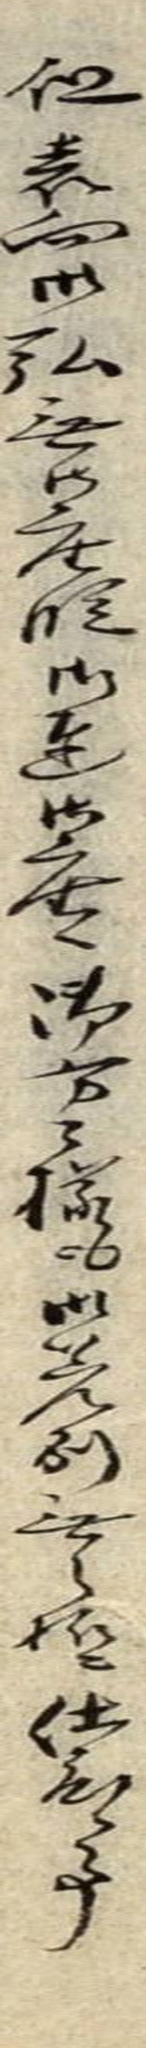但表向御弘無御座候段御達御座候御方々様へも御差別無之候様に仕度候事
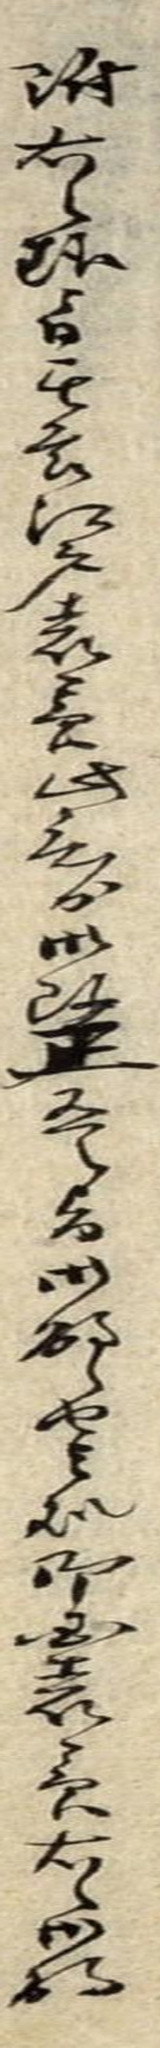附右之趣に付其節江戸表に而は此度ゟ御改正有之旨御触之由之候処御国表に而は右之御触
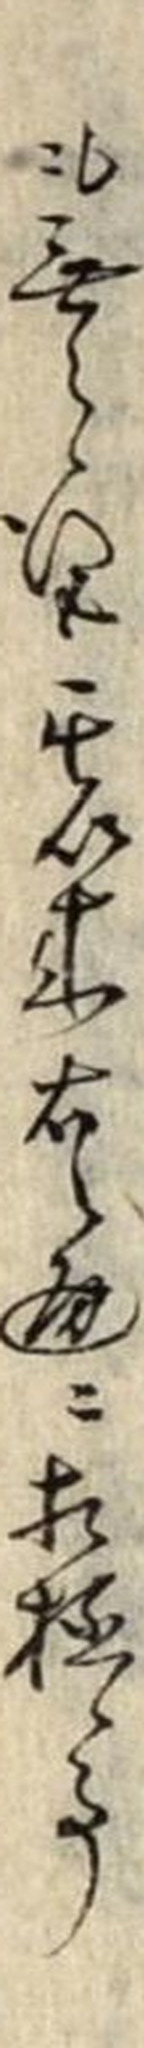も無之候得共其以来右之通に相極候事
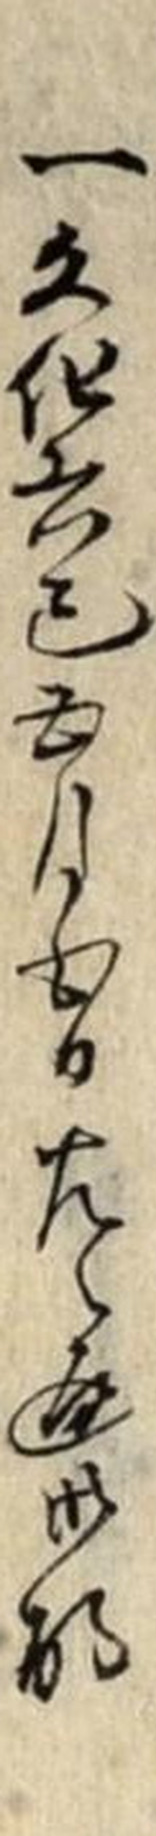一文化六巳五月五日左之通御触
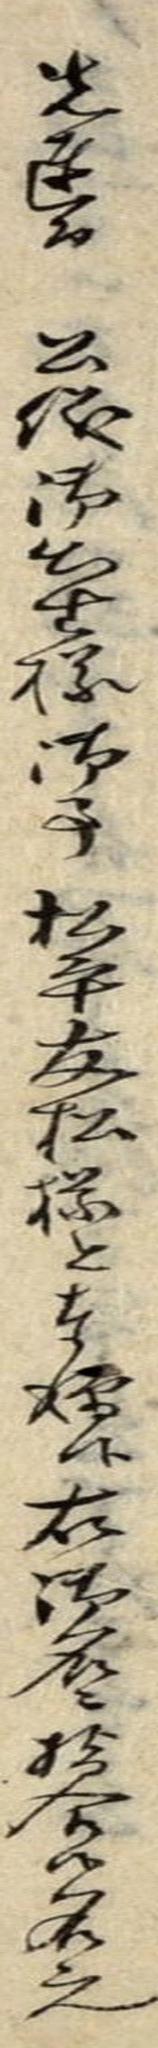先達而公儀御出生様御事松平友松様と奉称候右御名に指合候名元

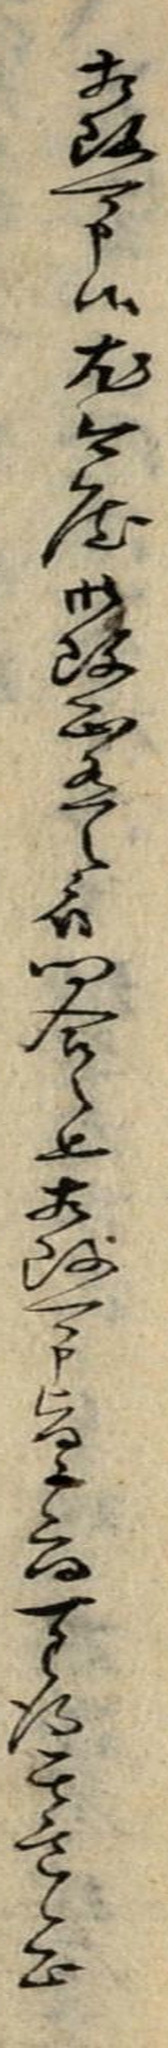相改可申候尤今度御改正有之候付問合候上相改可申旨に候間可被得其意候以上
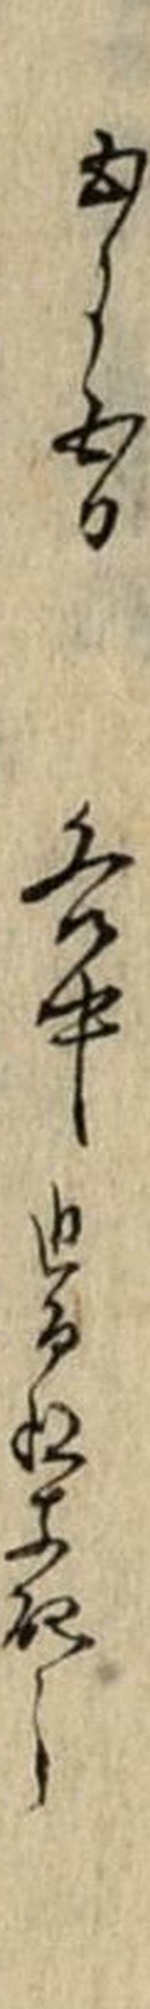五月五日各中追而組支配御目付
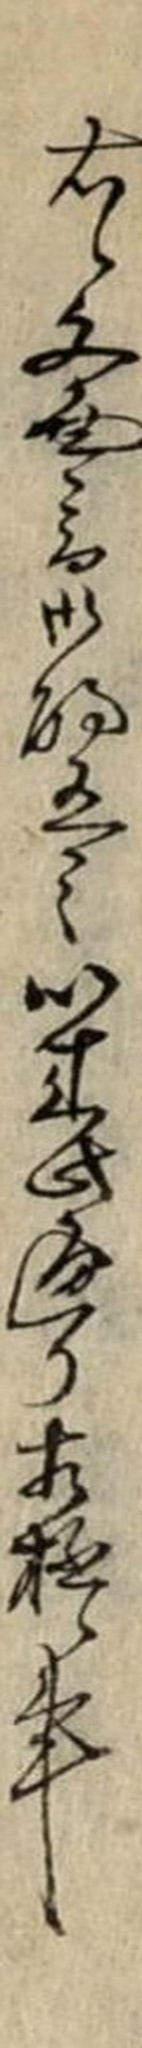右之文面に而御触有之以来此通り相極候事
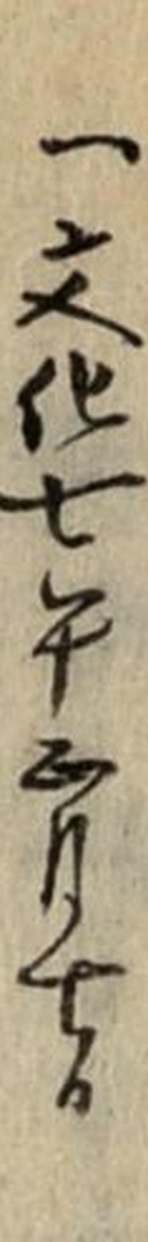一文化七午正月七日
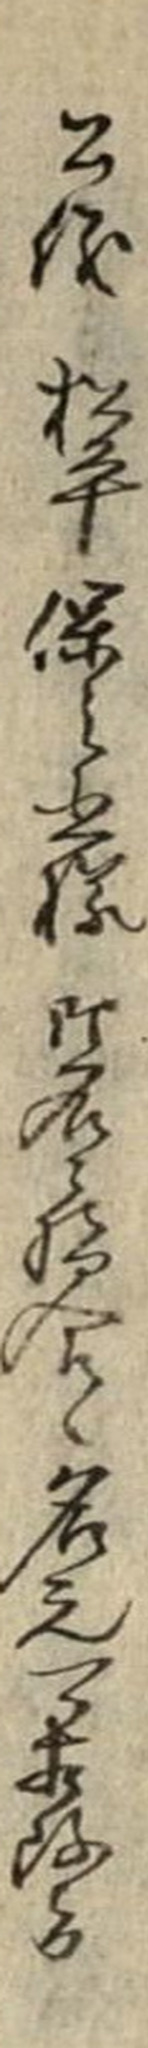公儀松平保之丞様御名に指合候名元可相改旨
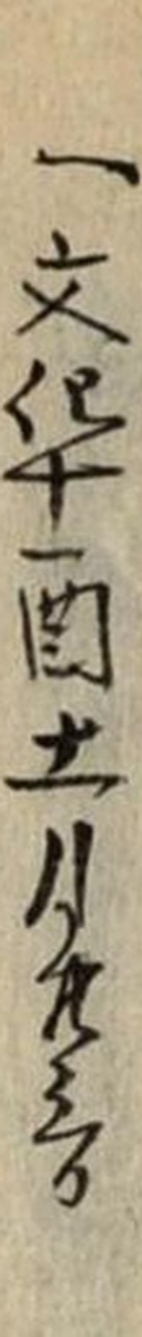一文化九酉十一月廿三日
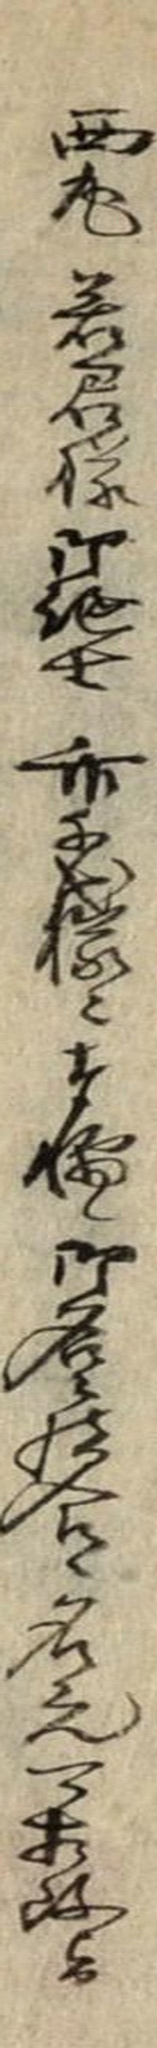西丸若君様御誕生竹千代様と奉称候御名に指合候名元可相改旨
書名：蒐輯之部
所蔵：福井県文書館 Fukui Prefectural Archives
